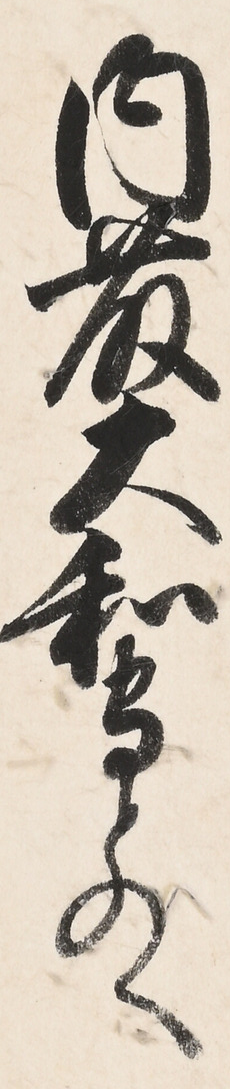内藤大和守とのへ

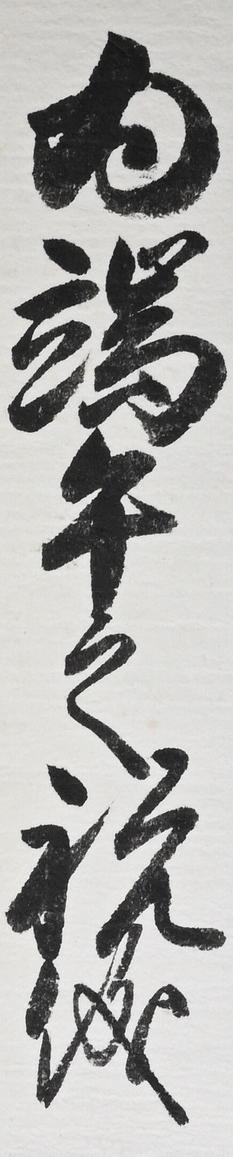為端午之祝儀
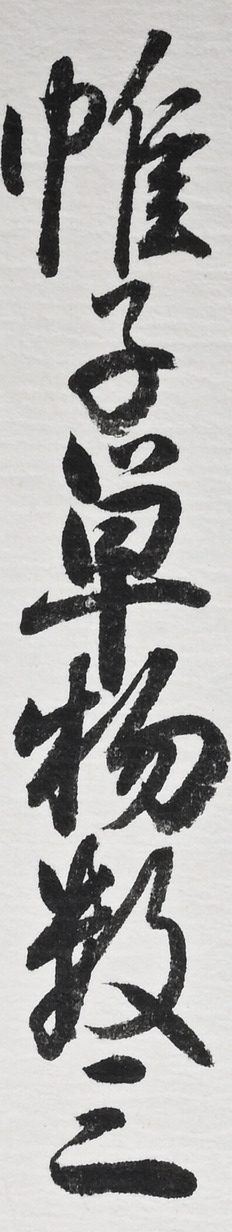帷子単物数三
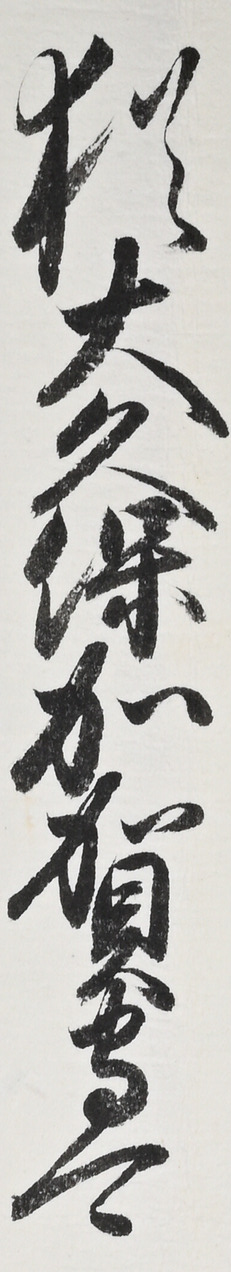猶大久保加賀守可
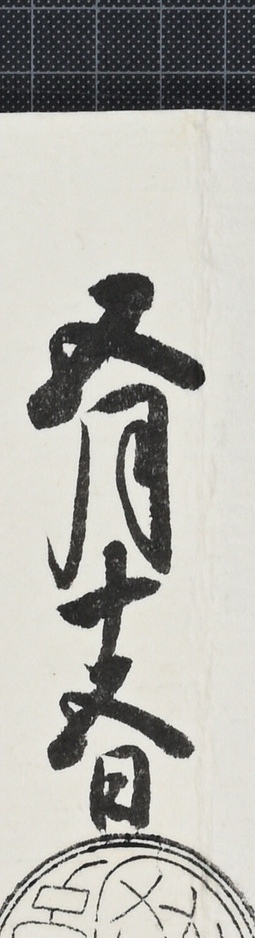五月十五日
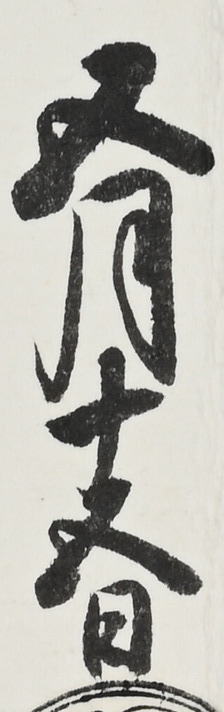五月十五日
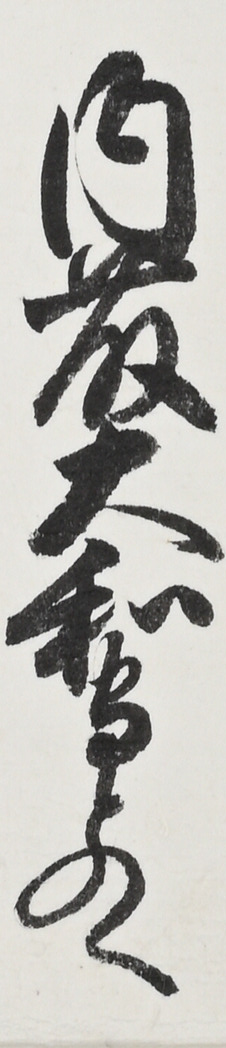内藤大和守とのへ
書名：御内書
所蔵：伊那市立高遠町図書館・合同会社AMANE
